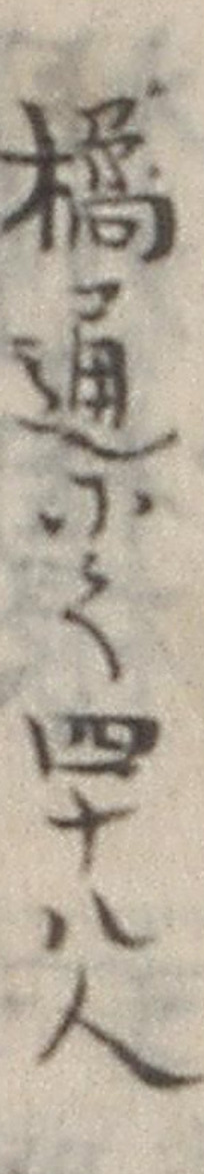橘通にて四十八人
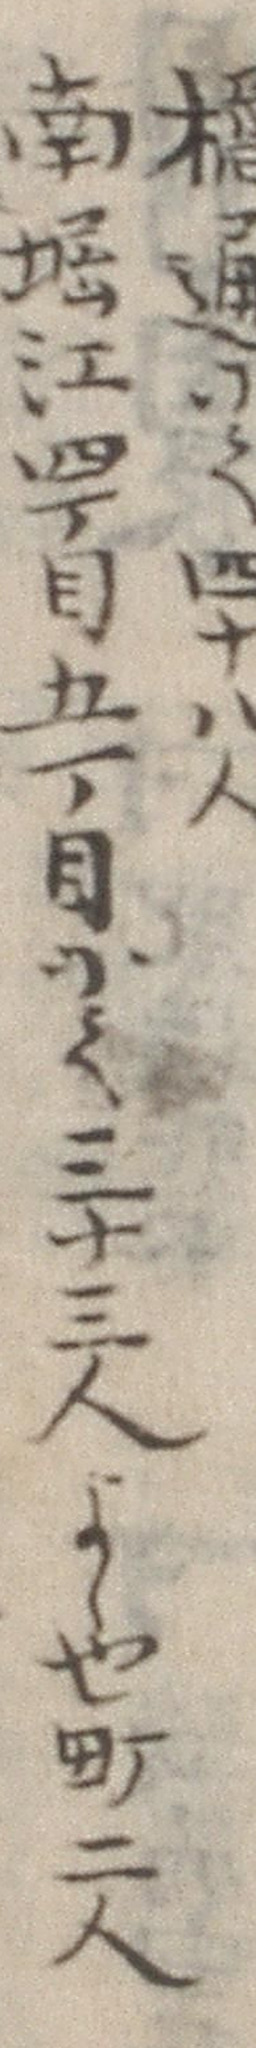南堀江四丁目五丁目にて三十三人よしや町二人
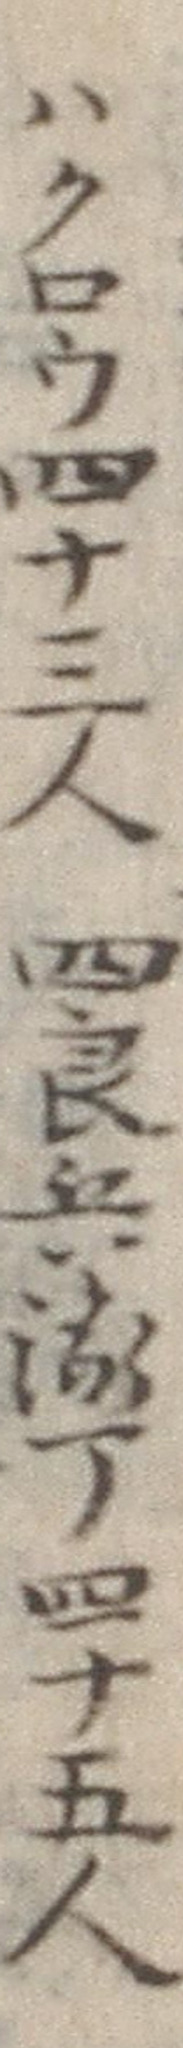ハクロウ四十三人四良兵衛丁四十五人
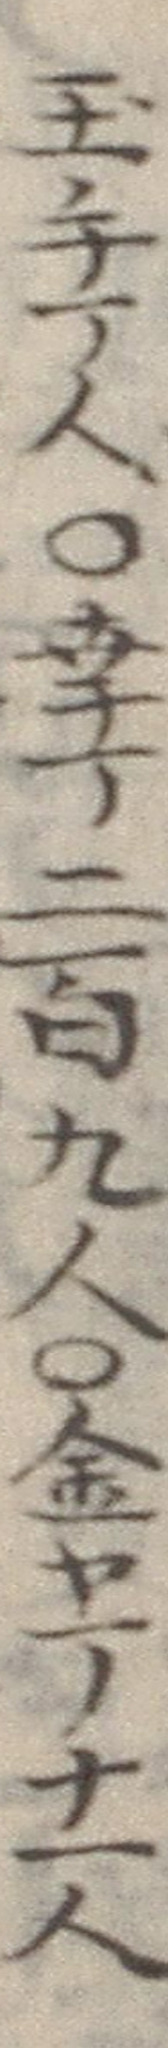玉午丁人○幸丁二百九人○金ヤ丁十一人
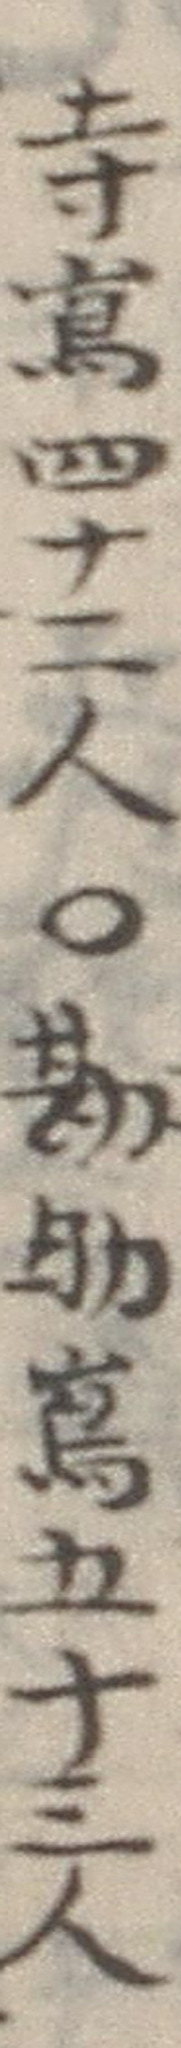寺嶌四十二人○勘助島五十三人
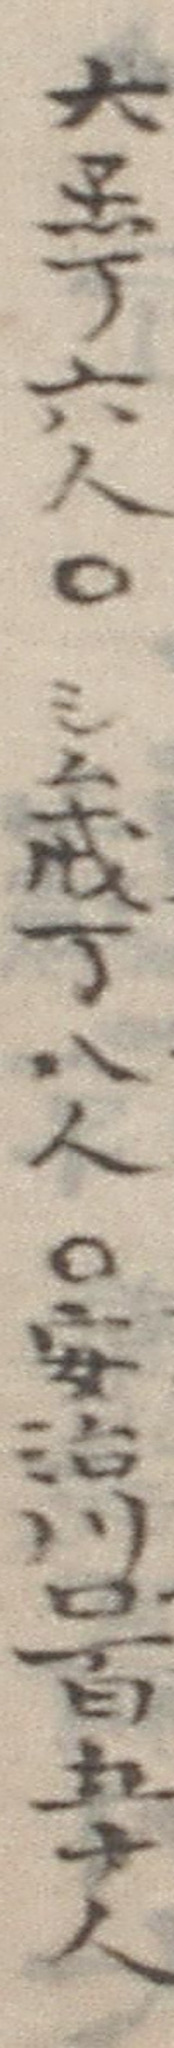大黒丁六人○シム戒丁八人○安治川口百五十人
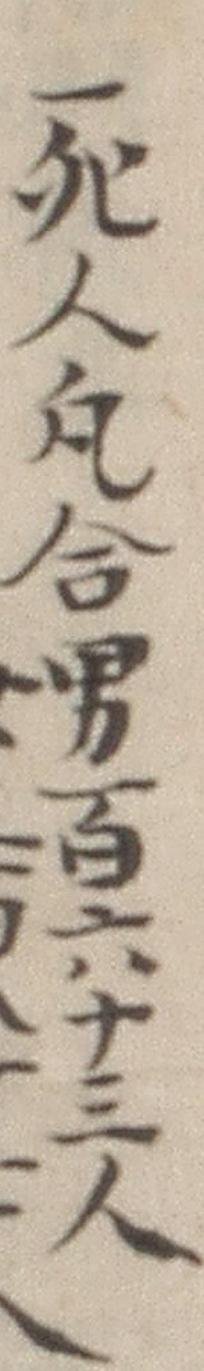死人凡合男百六十三人
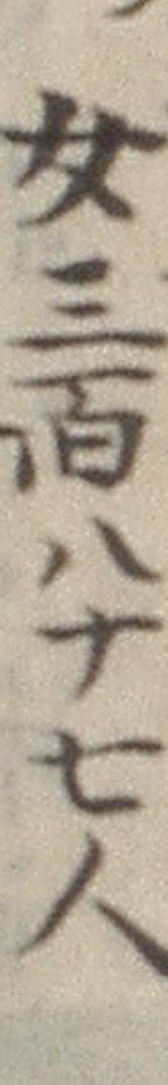女三百八十七人
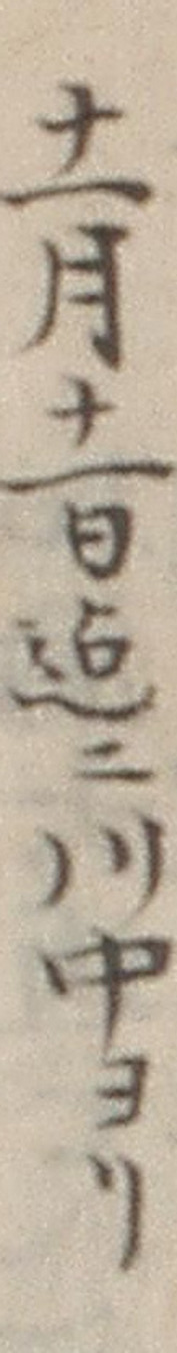十一月十一日迠に川中より
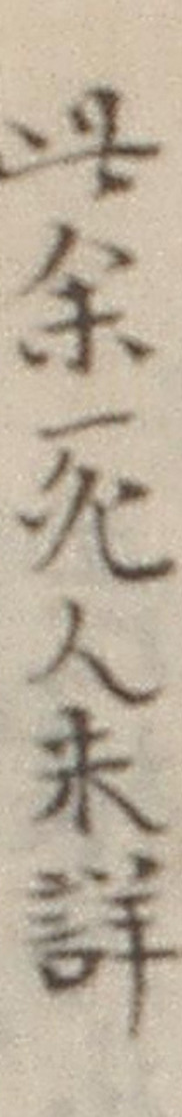此余死人未詳
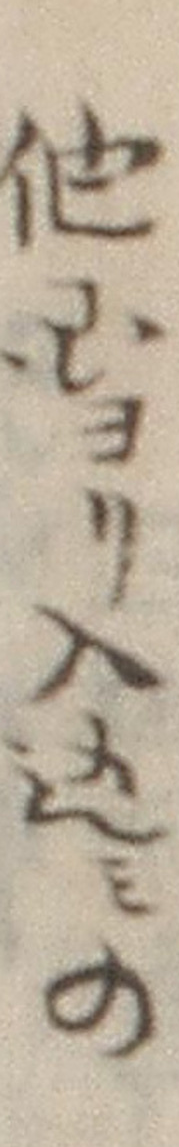他国より入込みの
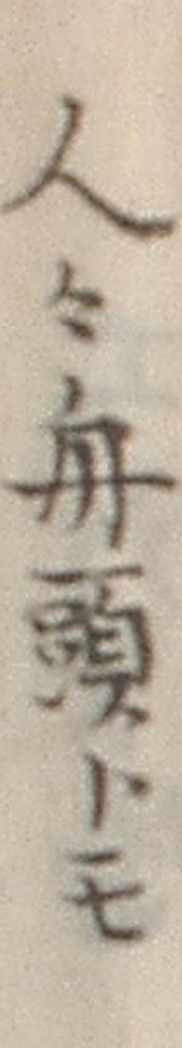人々舟頭とも
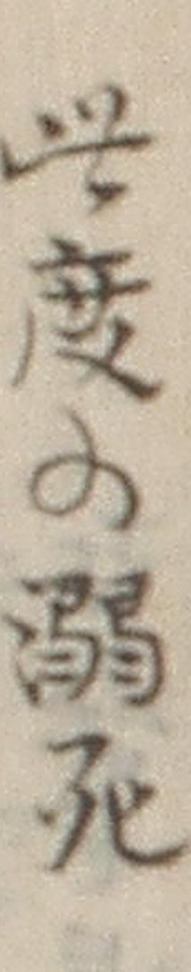此度の溺死
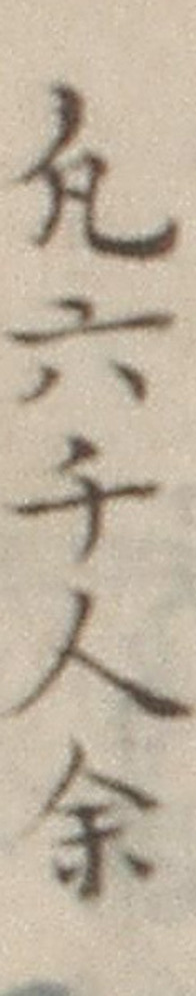凡六千人余

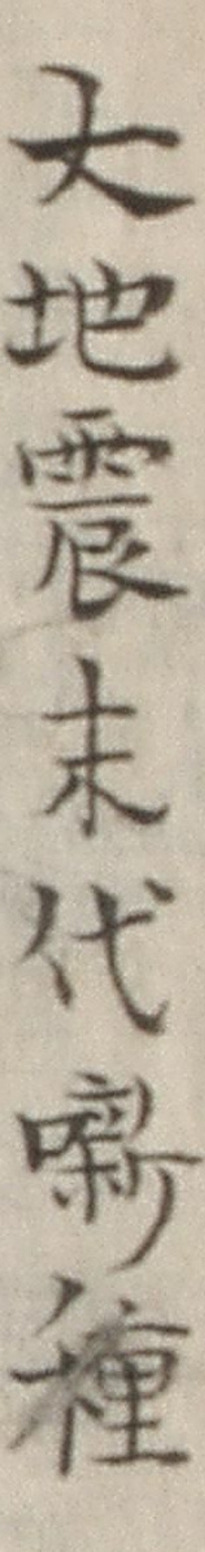大地震末代噺種
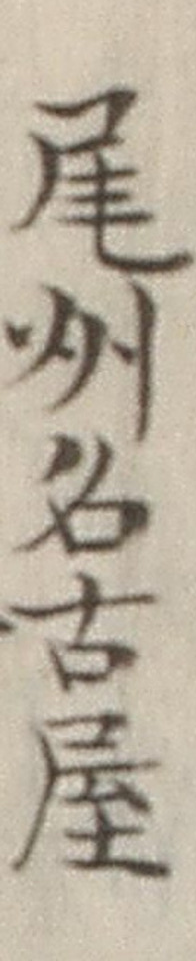尾州名古屋
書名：諸國大地震年代記末代噺種
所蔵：東京大学地震研究所図書室 Earthquake Research Institute Library, The University of Tokyo, JAPAN
